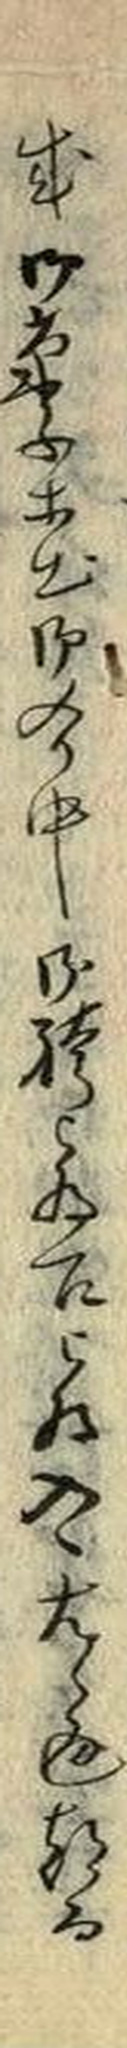成御菓子等出御入り中御袴被為召被為入候右之通都而
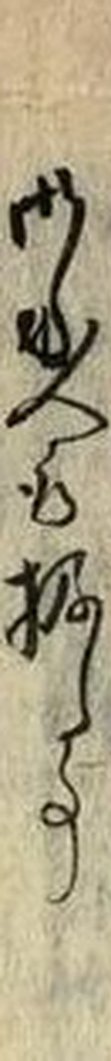御用人取扱候事
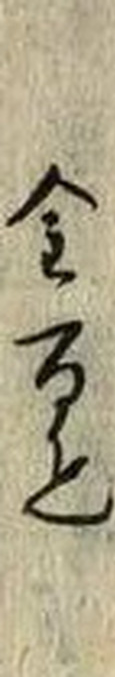金百疋
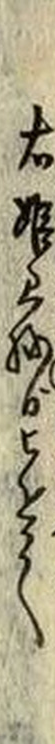右姫君様ゟ被進之
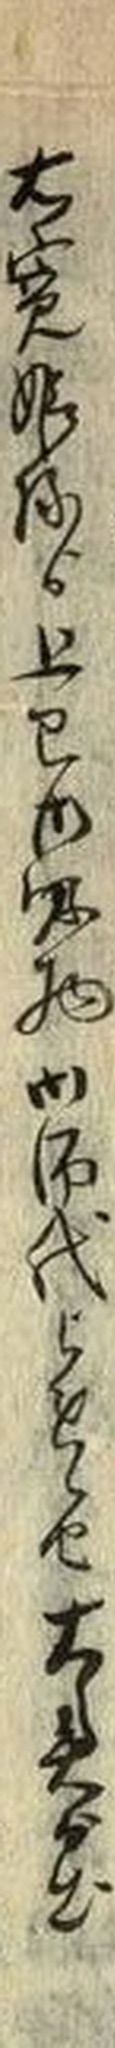右寛姫様ゟ上巳御吸物御酒代被進候由大奥ゟ出
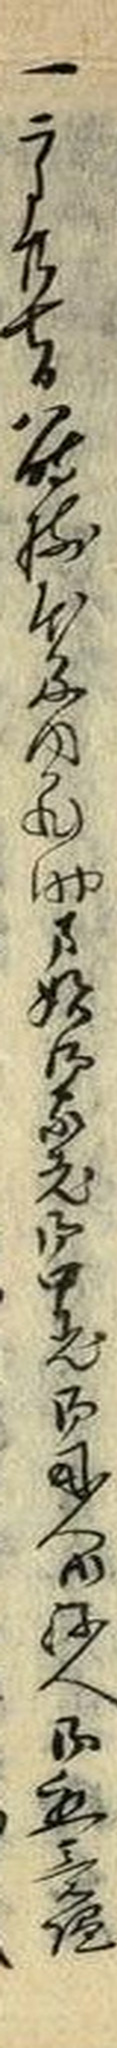一二月廿七日八時揃本多内蔵助方土始御家老御中老御用人御役人御懇意隠
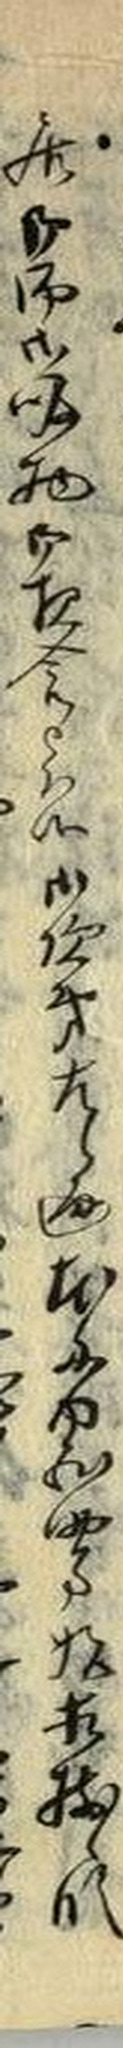居御酒御吸物御夜食被下候御次第左之通本多内蔵助方始相揃候段
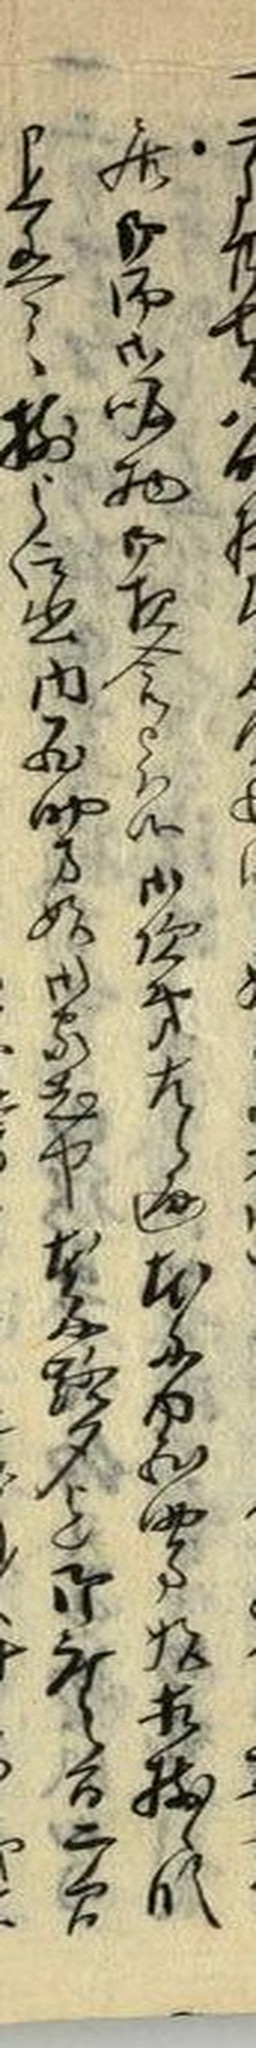申上有之揃被仰出内蔵助方始御家老中本多路夕迄御座之間二ノ間
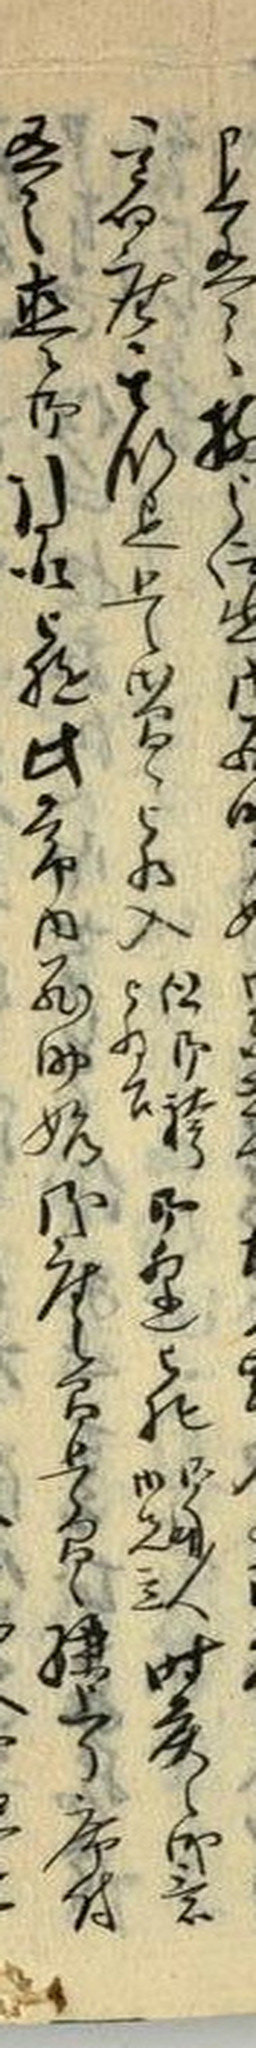有之直ニ御引取被遊此節内蔵助始御座之間上之間へ繰上り席付
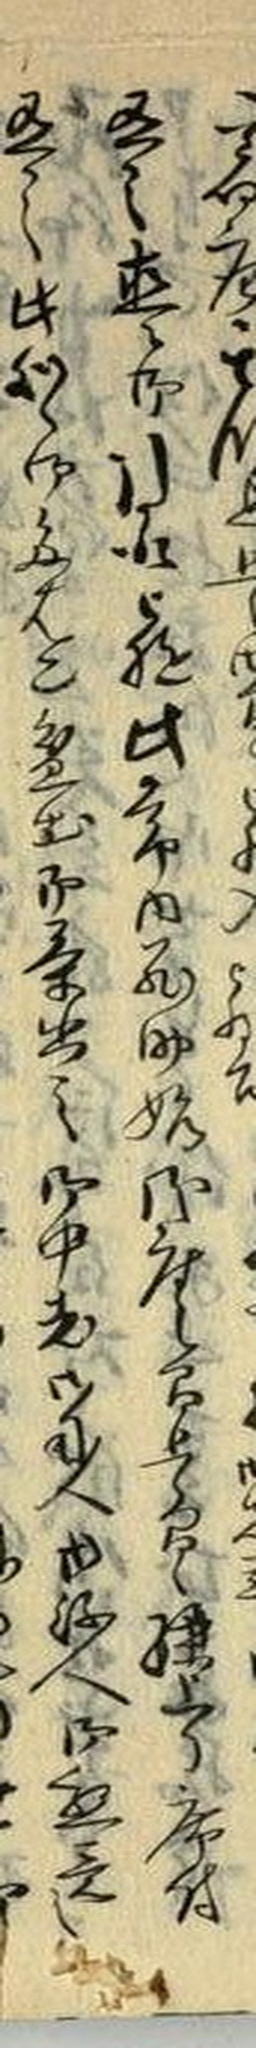有之此処へ御たはこ盆出御茶出之御中老御用人御役人御懇意之
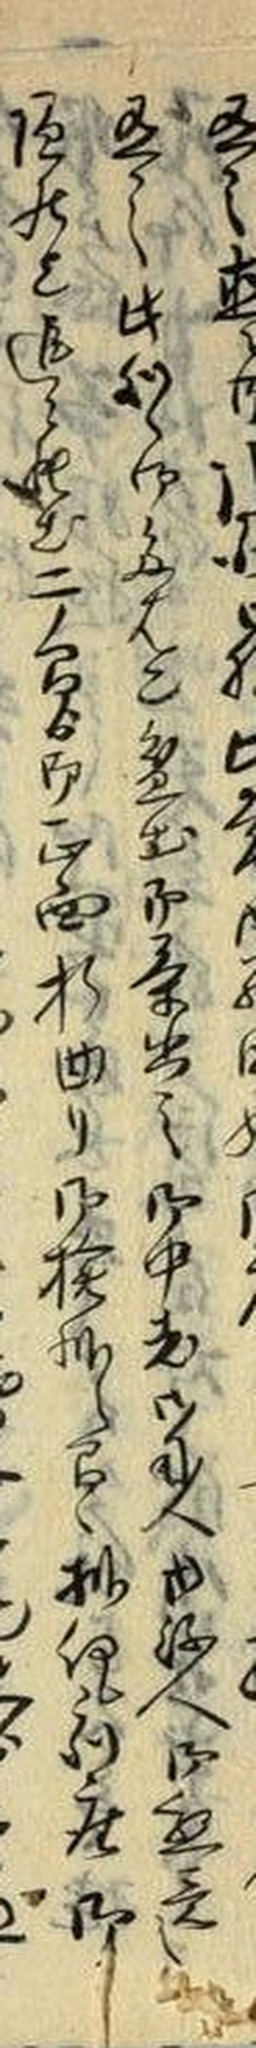隠居迄追々罷出二ノ間ゟ御正面折曲り御槍掛之間へ掛何も御列座御
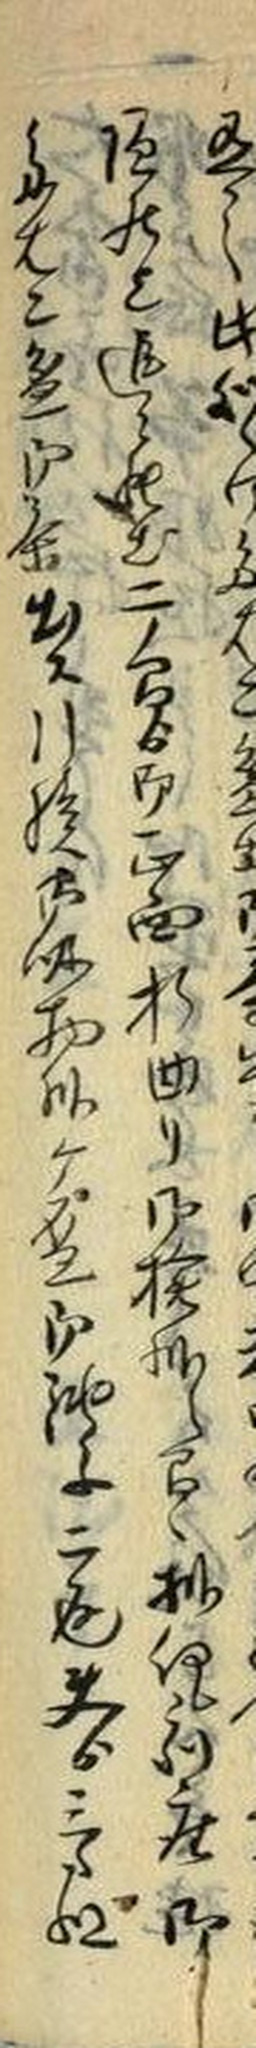たはこ盆御茶出ス引続御吸物掛ケ盃御銚子二通夫ゟ三ツ組
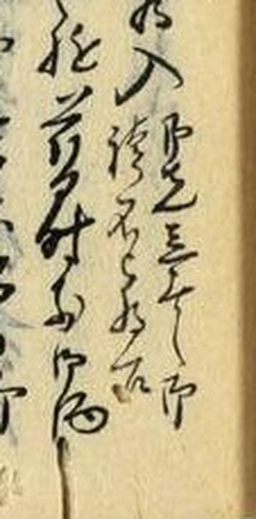袴不被為召
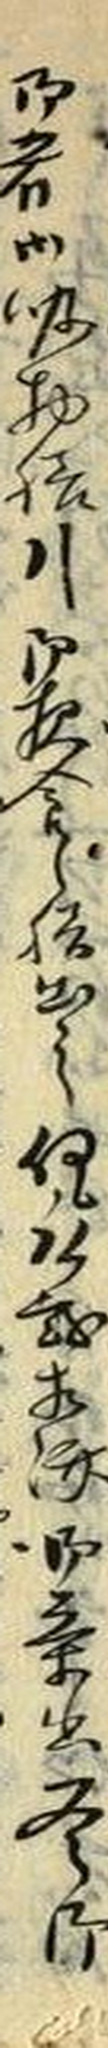御肴御吸物膳引御夜食之膳出之何も頂戴相済御茶出又々御
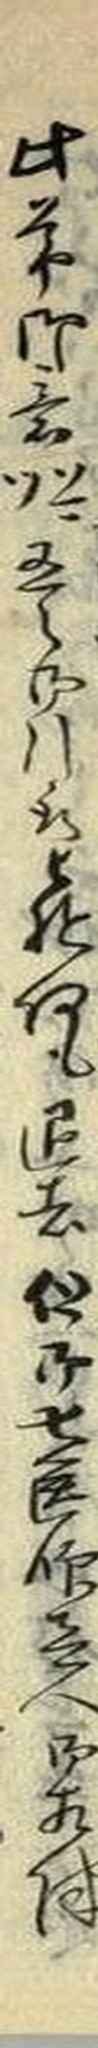ツ有之御引取被遊何も退去但御匙医師壱人御相伴
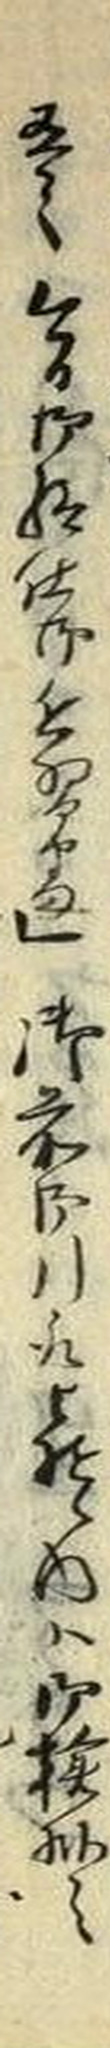有之今日御給仕御近習番」御前御引取被遊候内ハ御槍掛之
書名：少傅日録抄（斉承付側向頭取日記、在国）
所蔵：福井県文書館 Fukui Prefectural Archives
